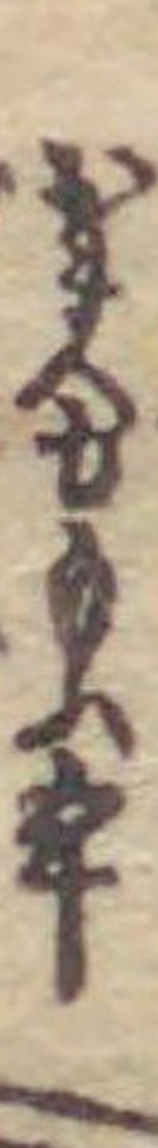おまへももふ五十
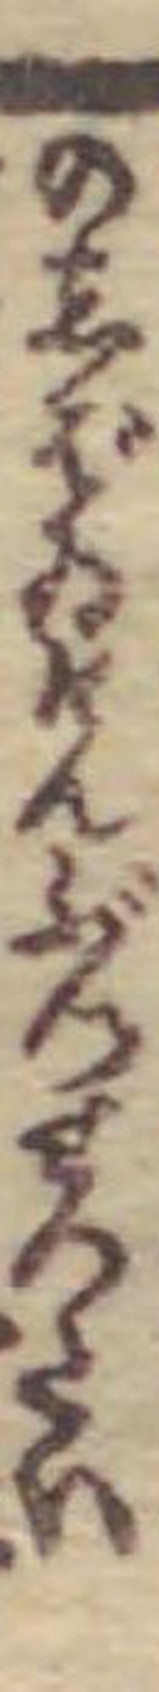のしばゐけんぶつせつたい
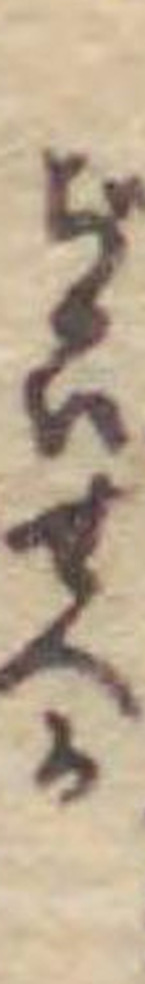ぢかいせへか
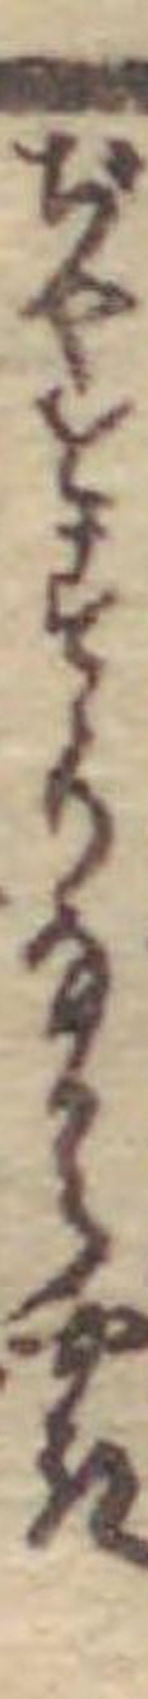ぢやをすゝりなからやき
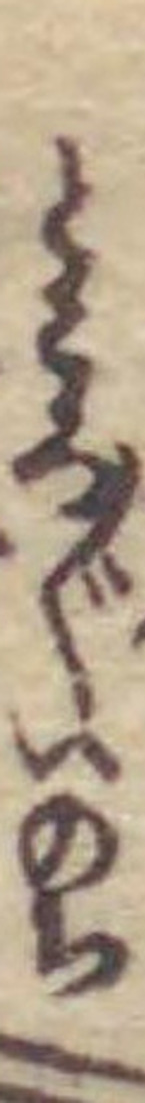ところ〴〵いのち
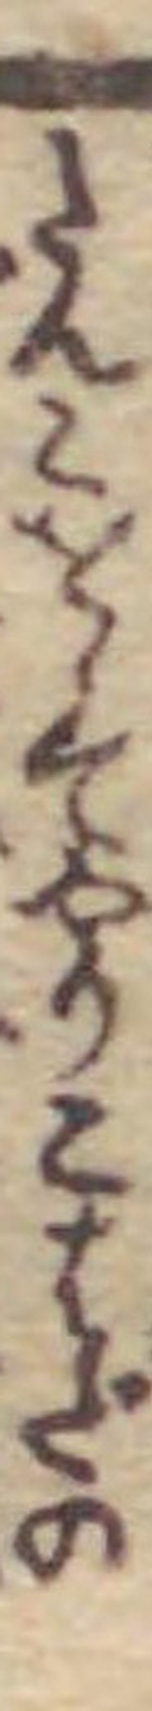たんこをしてやりこはだの
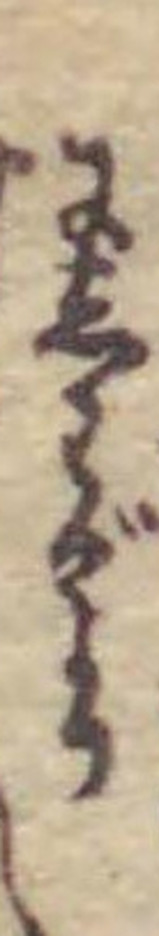にしわがより
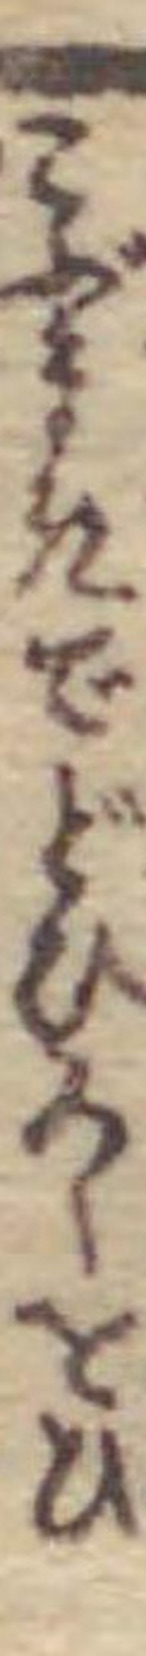こぶまきでどひろくをひ
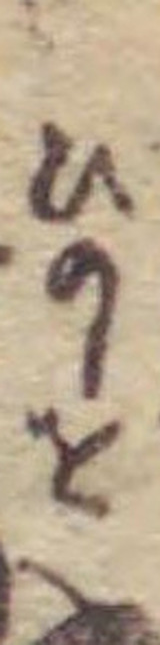ひのしを
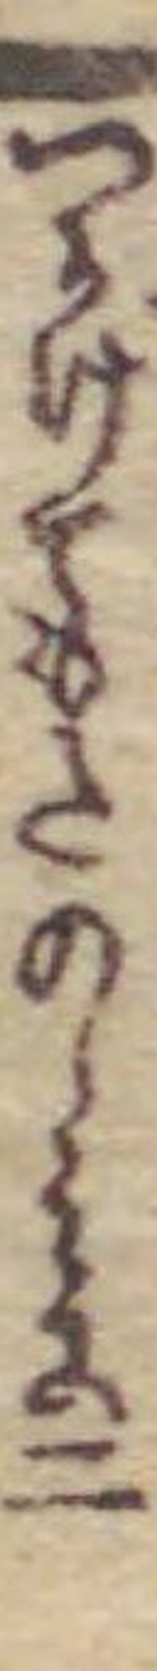つかけてもたのしみに二
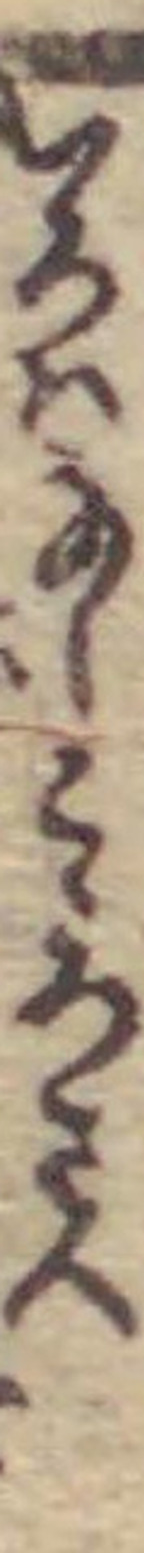いろはなしこゝろさへ
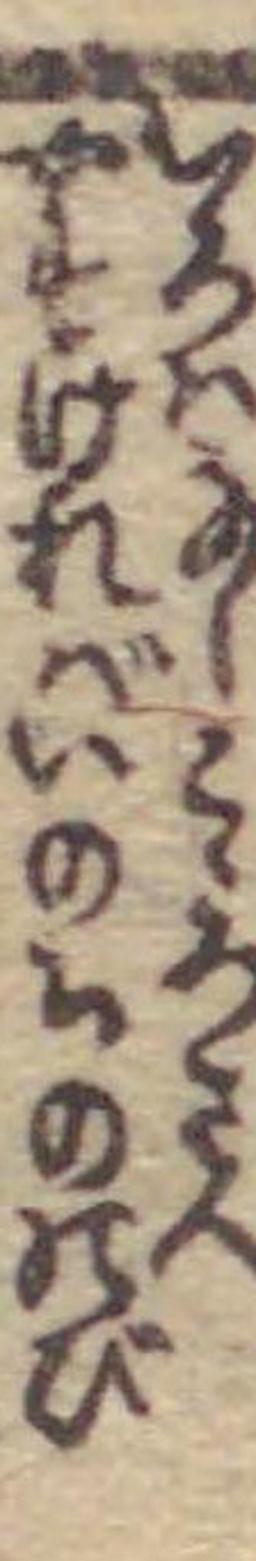やすければいのちののび
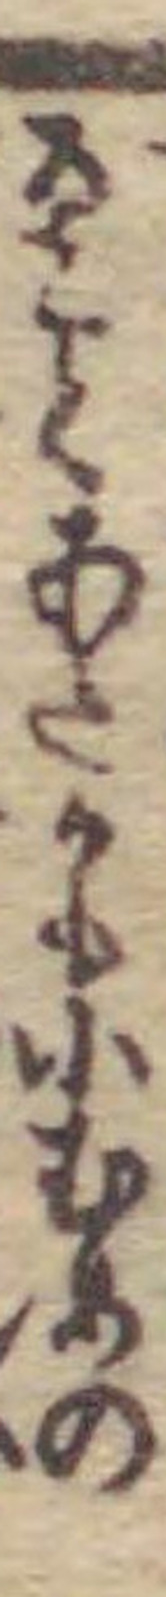ることあたかも小むめの
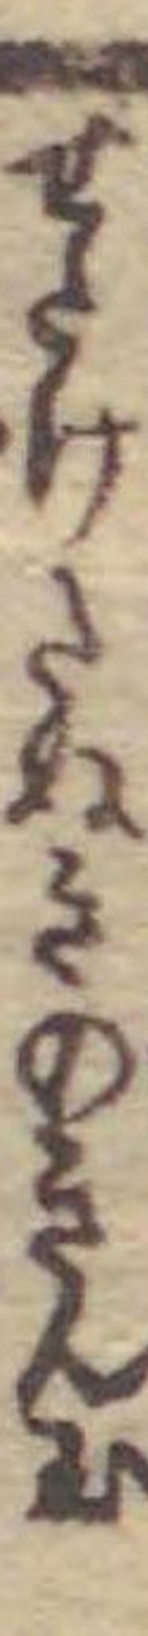せたけたぬきのきん玉
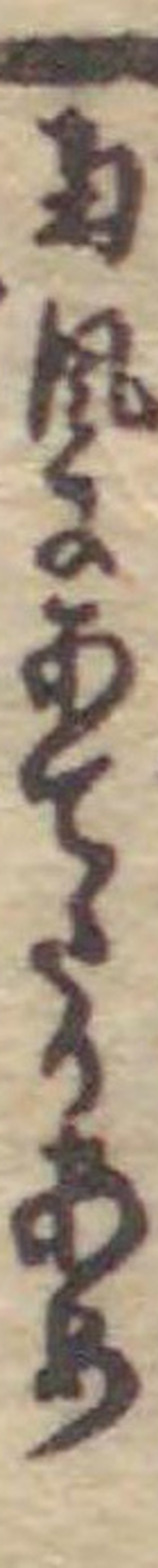当風にあてたりあめ
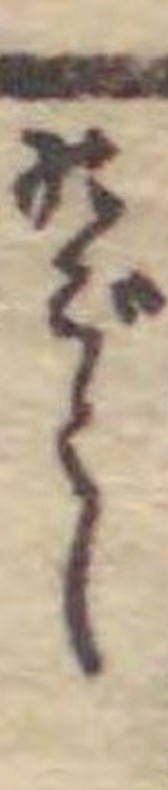のごとし
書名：御誂染長寿小紋 : 3巻
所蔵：国立国会図書館 National Diet Library, JAPAN
